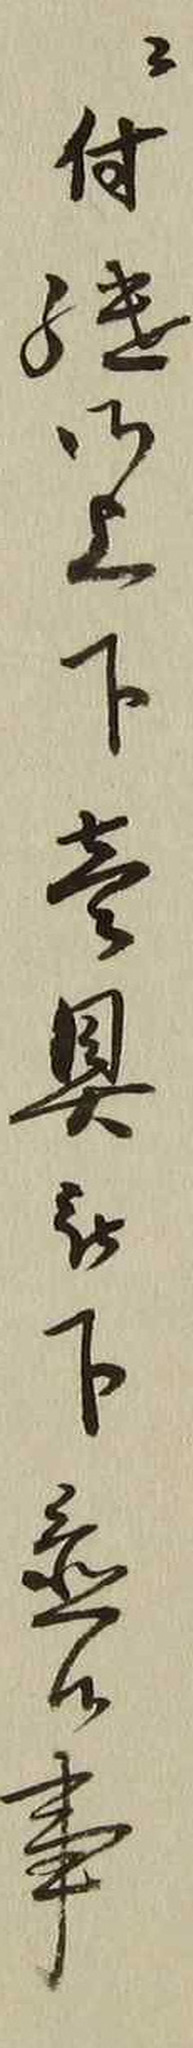に付継御上下壱具被下置候事
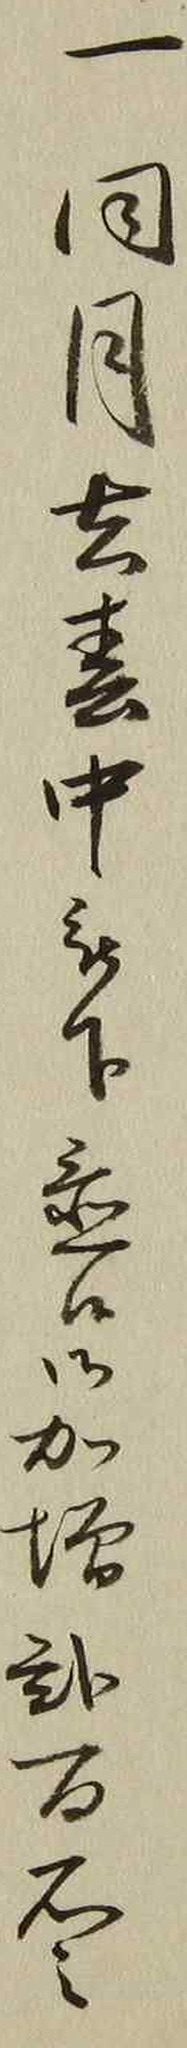一同月去春中被下置候御加増弐百石之
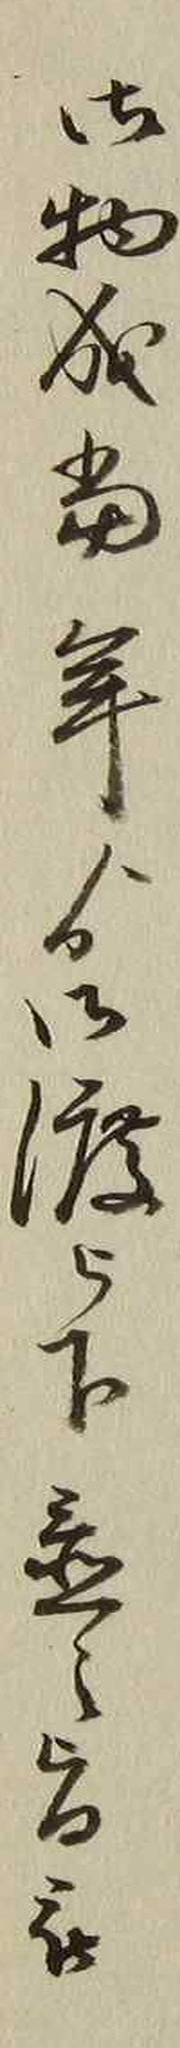御物成当年ゟ御渡被下置候旨被
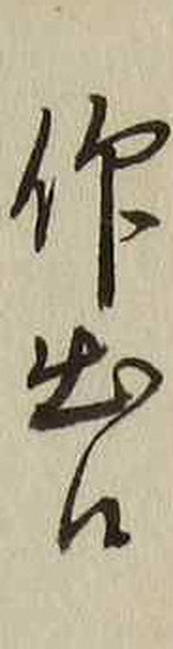仰出候
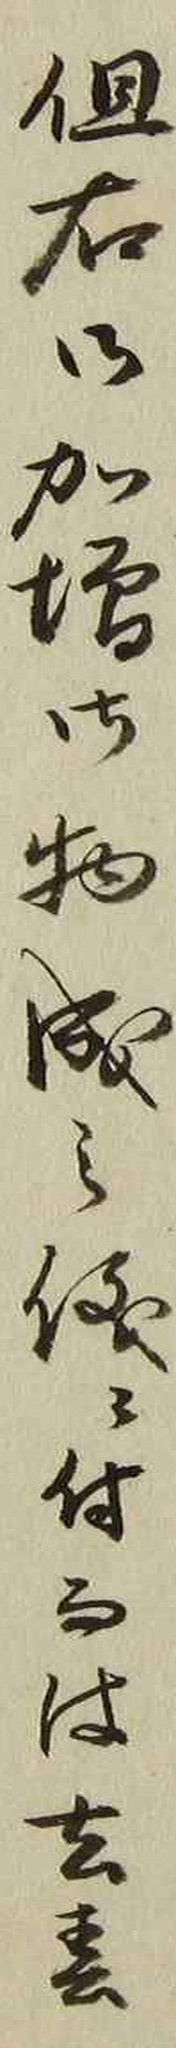但右御加増御物成之儀に付而は去春
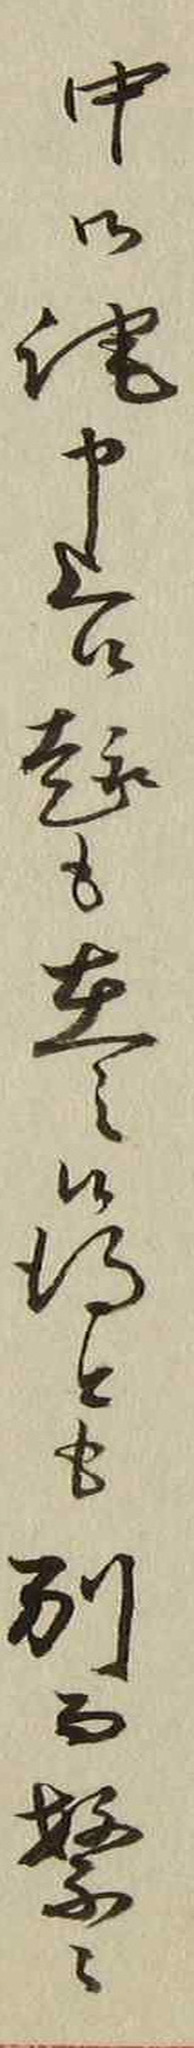中御詫申上候趣も在之候得とも別而繁々
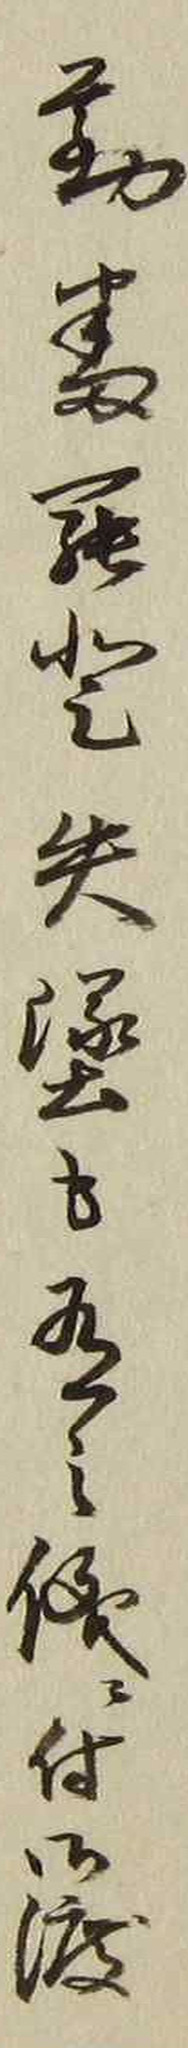勘番罷登失墜も有之儀に付御渡
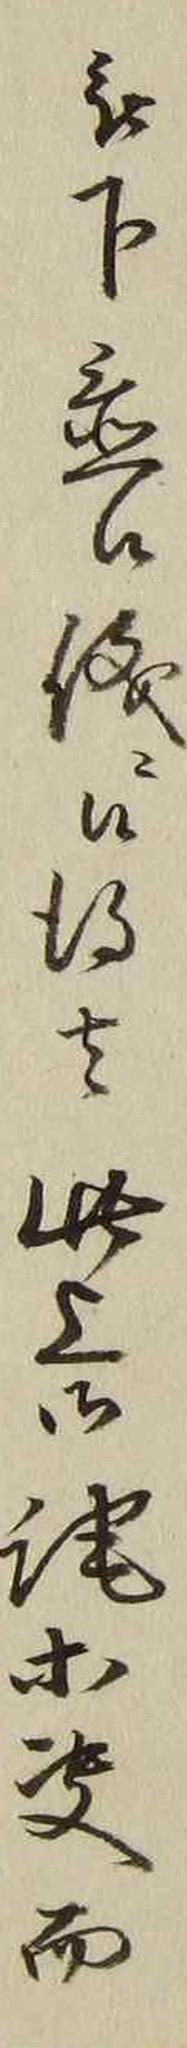被下置候儀に候得は此上御侘等決而
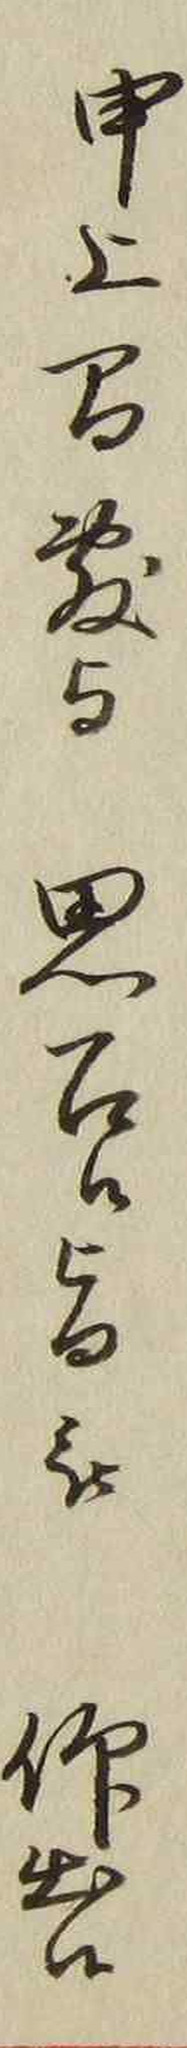申上間敷と思召候旨被仰出候
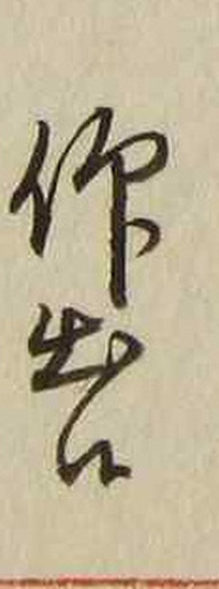仰出候

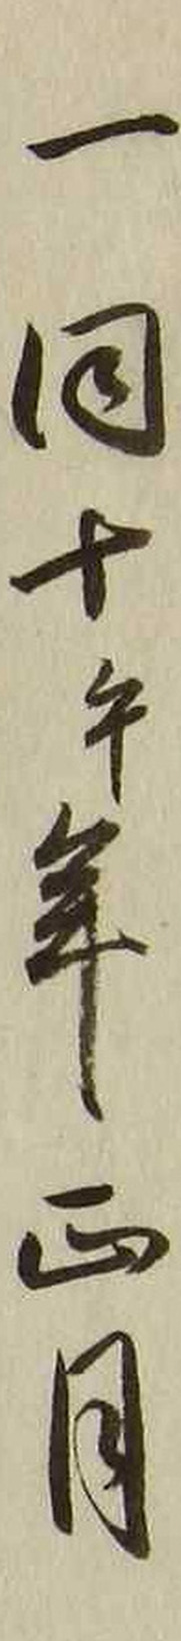一同十正月正月
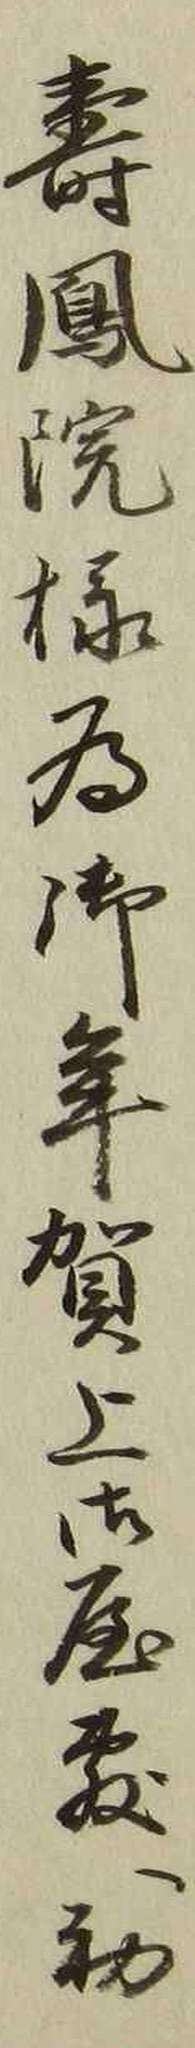寿鳳院様為御年賀上御屋敷へ初
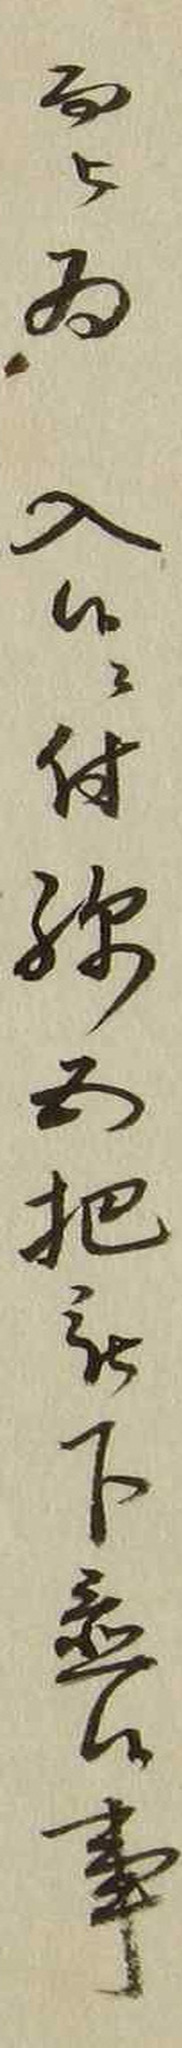而被為入候に付綿五把被下置候事
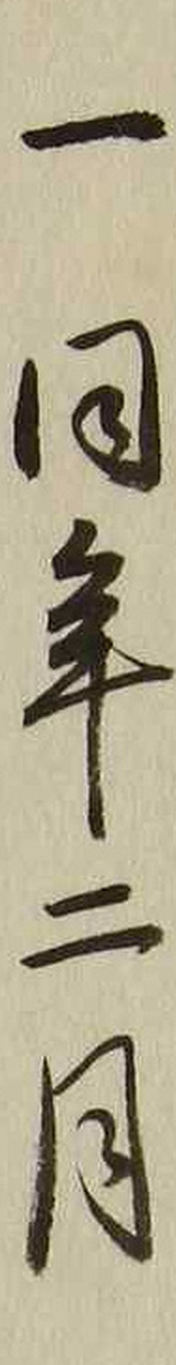一同年二月
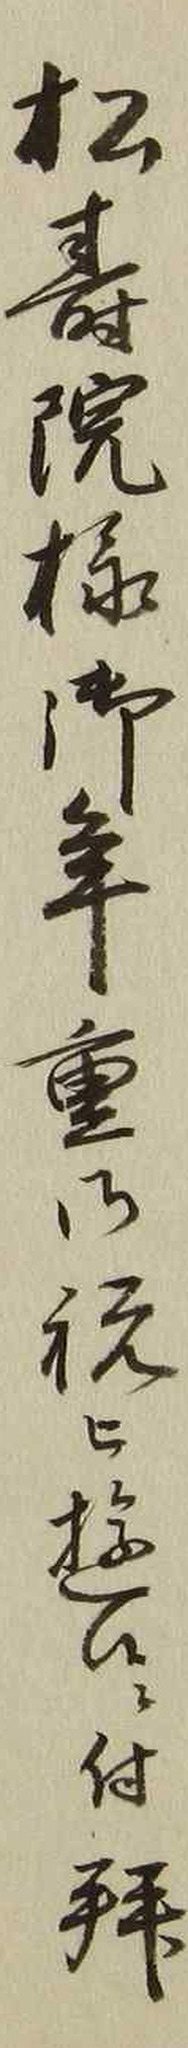松寿院様御年重御祝被遊候に付拝
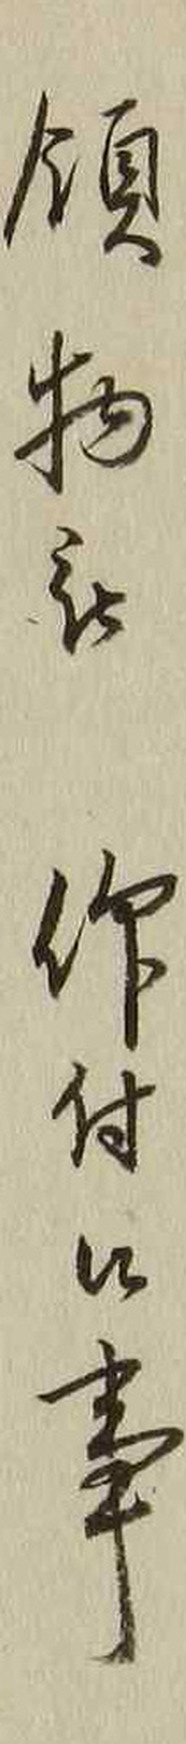領物被仰付候事
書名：諸士系譜　巻之125　た之部1
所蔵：会津若松市立会津図書館
